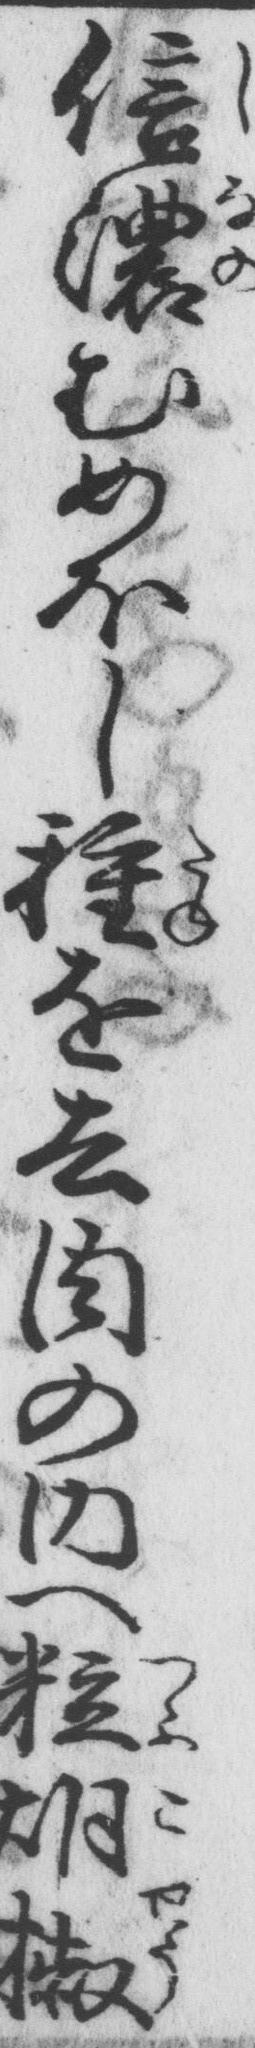信濃むめほし種を去肉の内へ粒胡椒
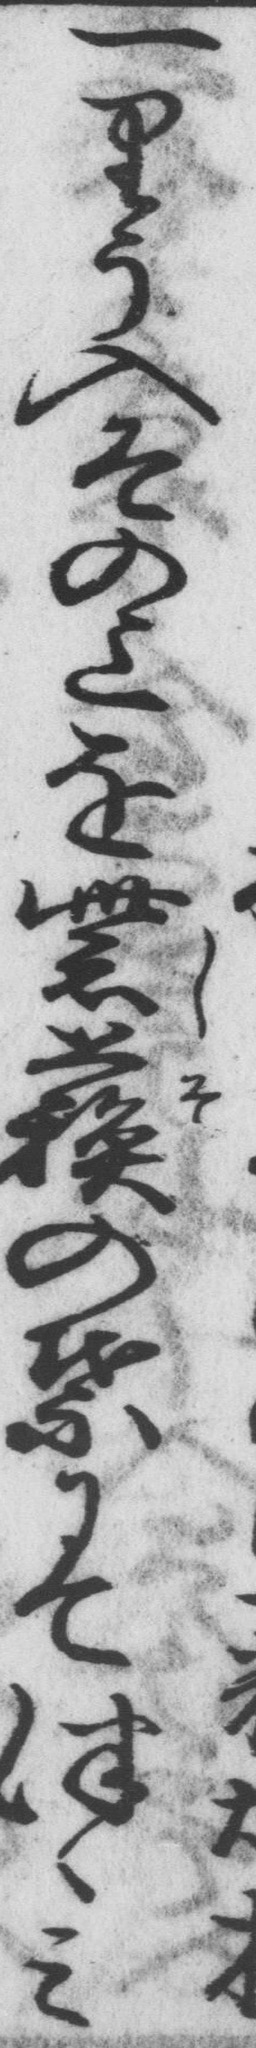一りう入その上を紫蘇の葉にてつゝみ
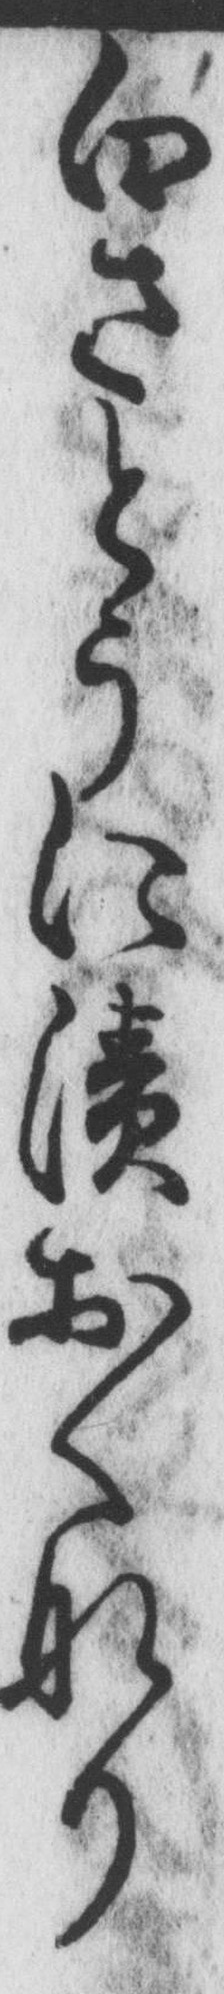白さとうに漬おくなり
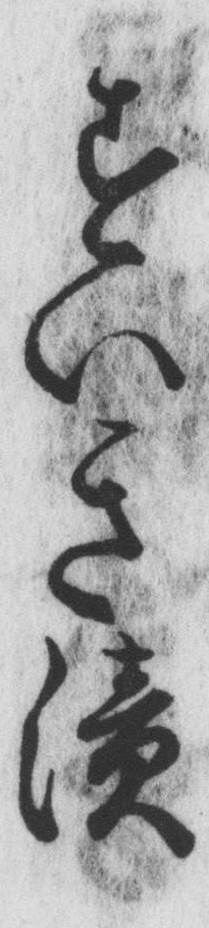すいき漬
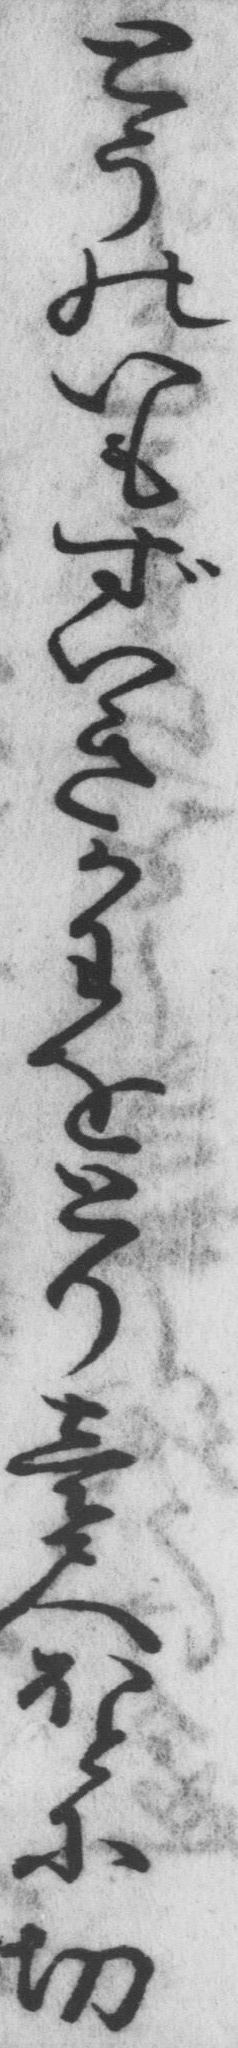とうのいもずいきかわをとり壱尺ほとに切
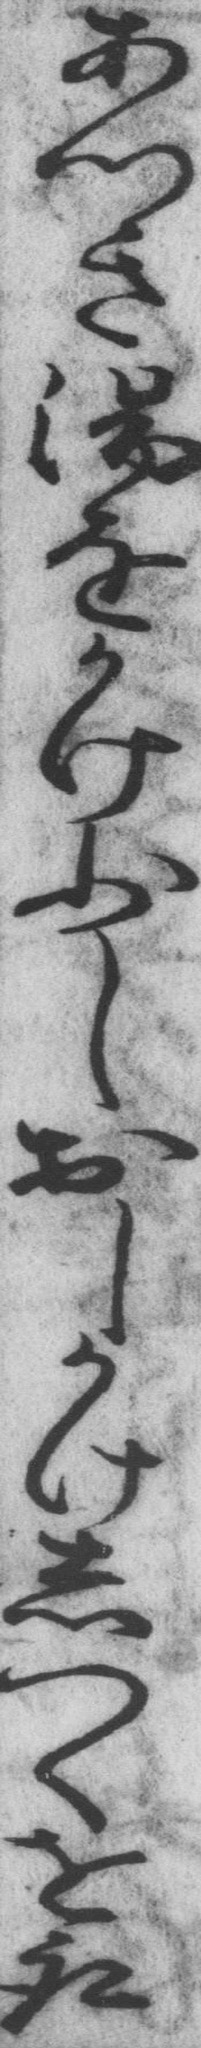あつき湯をかけ少しおしかけしつくを取

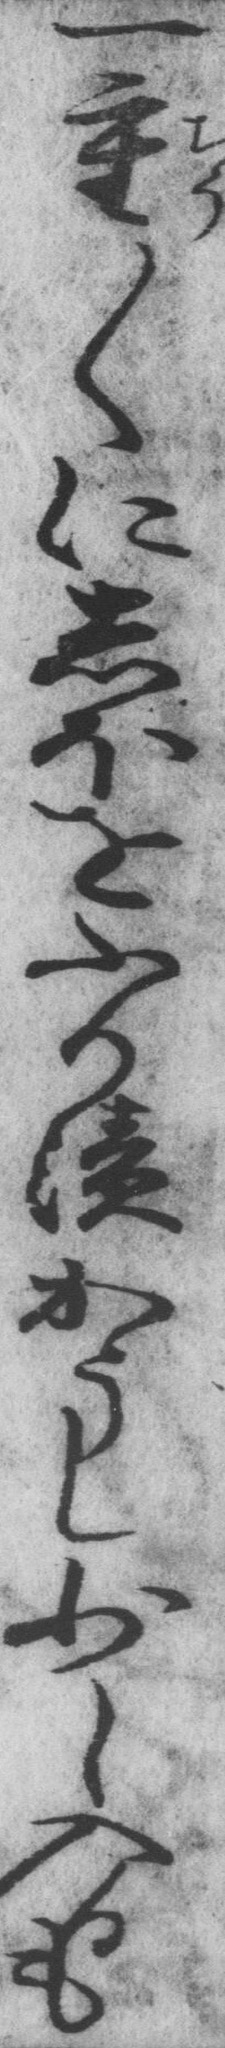一重〳〵にしほをふり漬かうし少し入るも
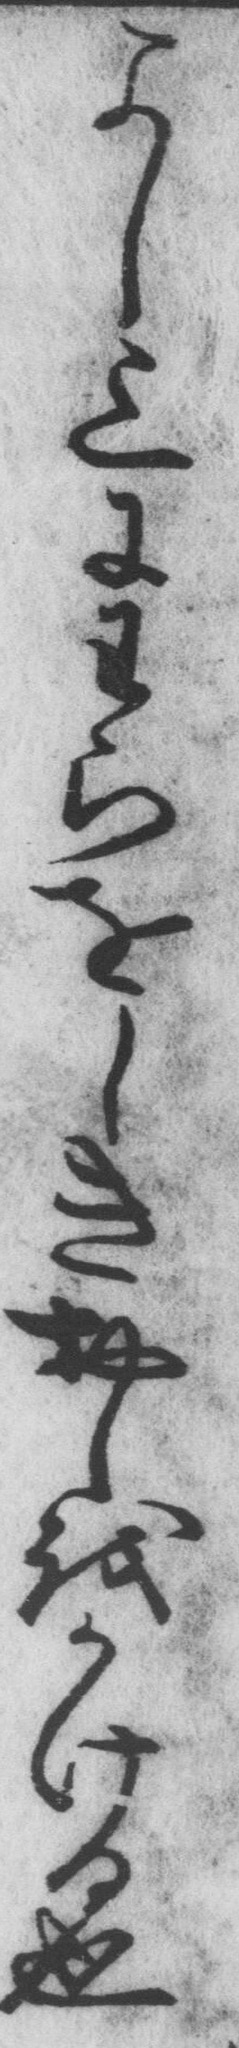よし上にわらをしきおしをかける也
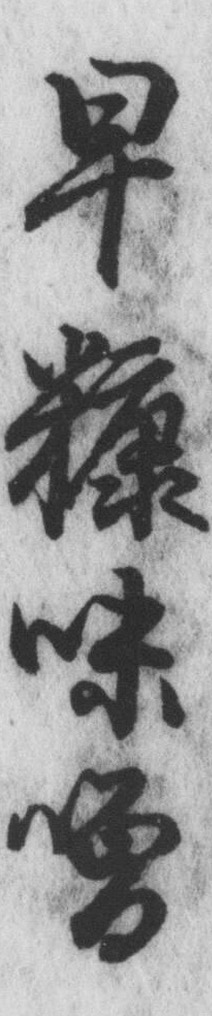早糠味噌
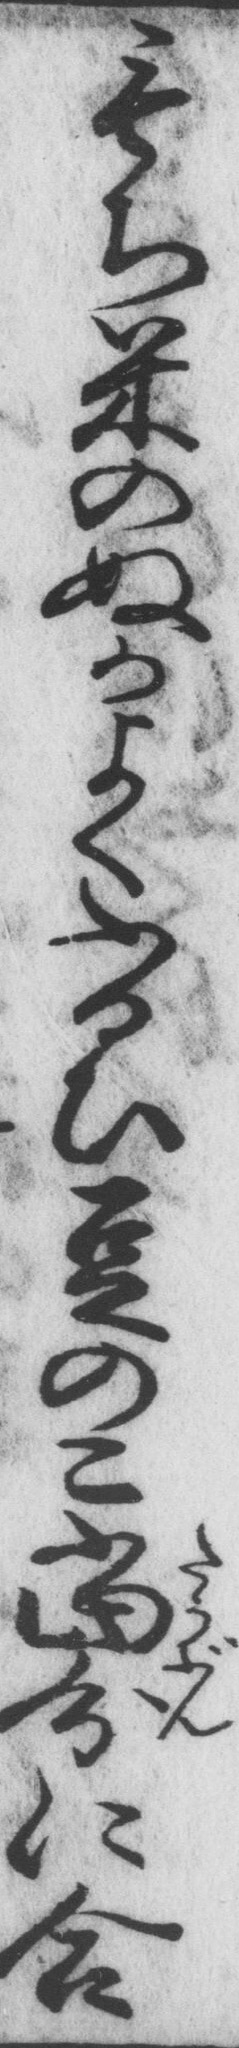もち米のぬかよくふるひ豆のこ当分に合
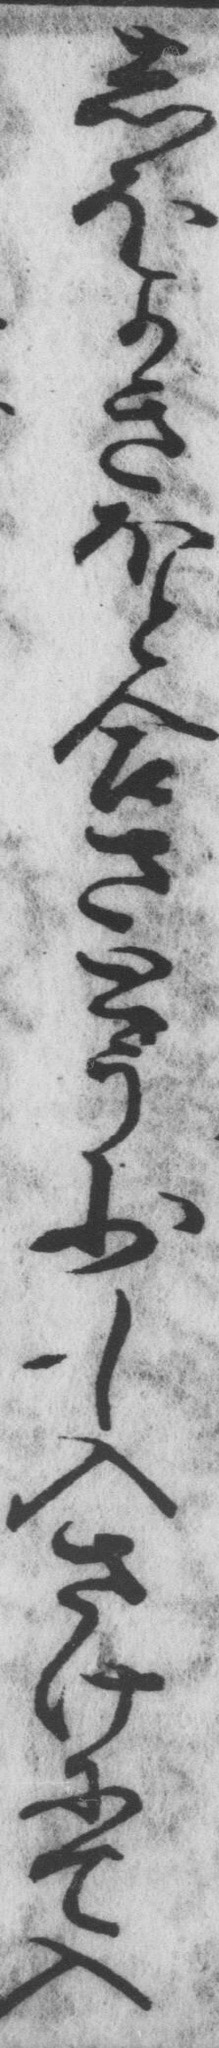しほよきほと合さとう少し入さけにて入
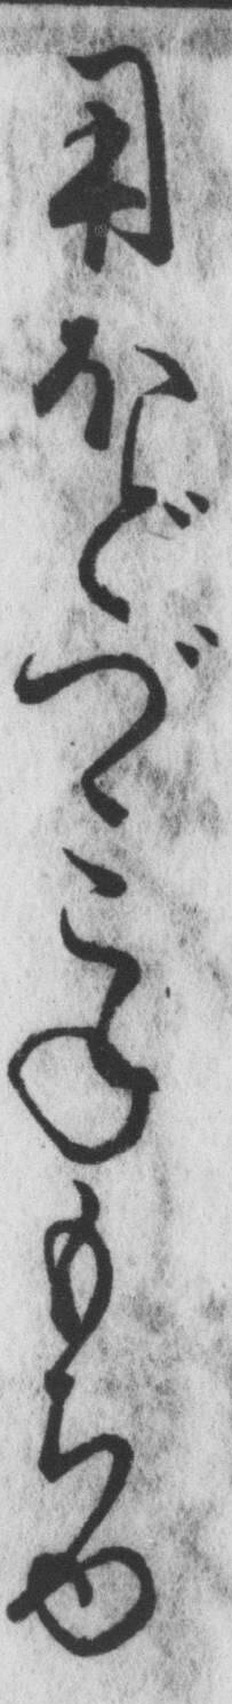用ほどづゝこねもちゆ
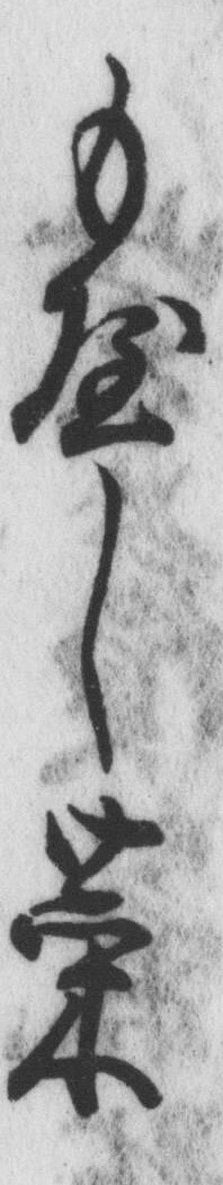もやし菜
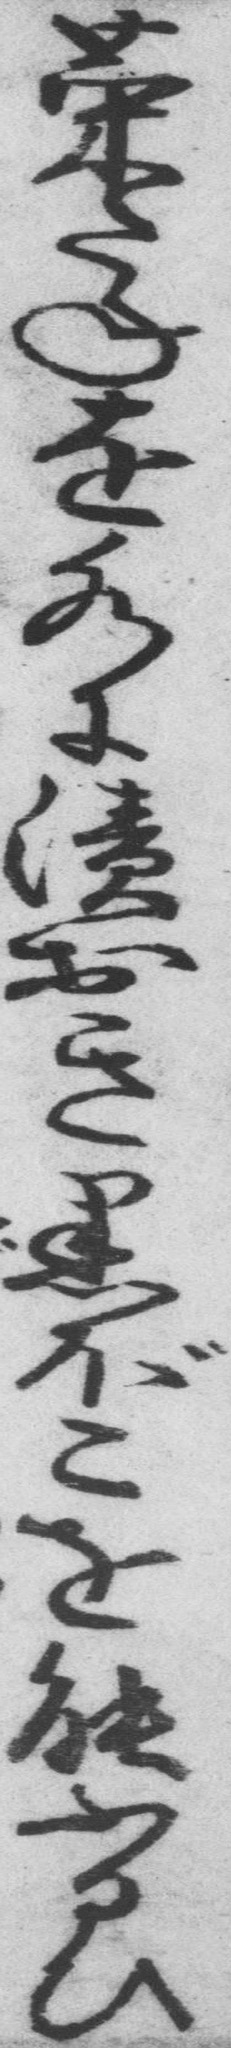菜たねを水に漬おき黒ぼこを能ふるひ
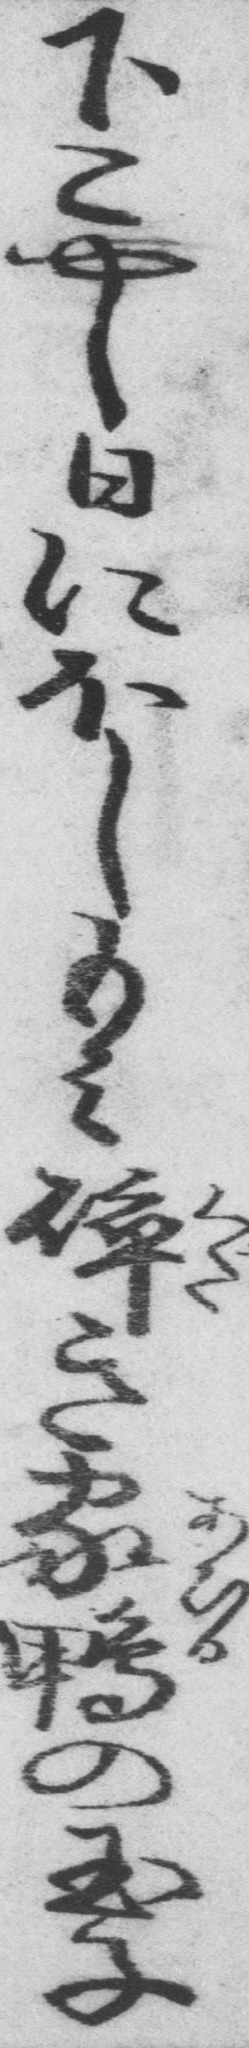下こやし日にほしもみ砕き家鴨の玉子
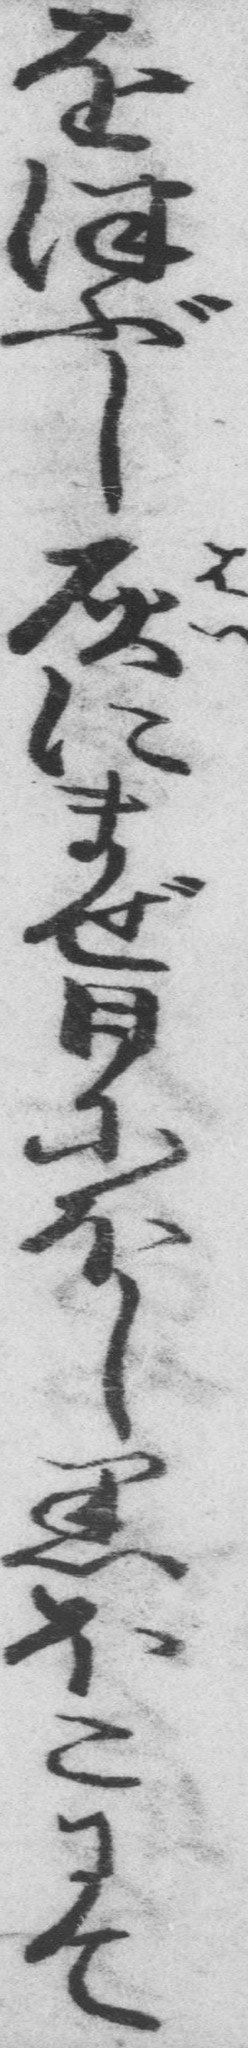をつぶし灰にまぜ日にほし黒ほこにて
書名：料理山海郷
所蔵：大阪府立大学学術情報センター 国文学研究資料館
